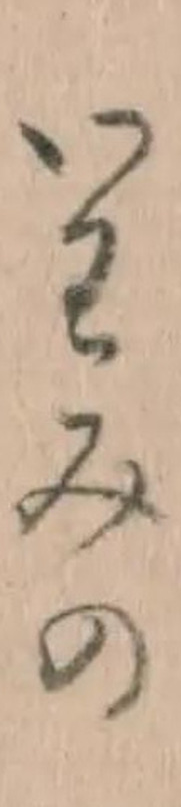いわみの
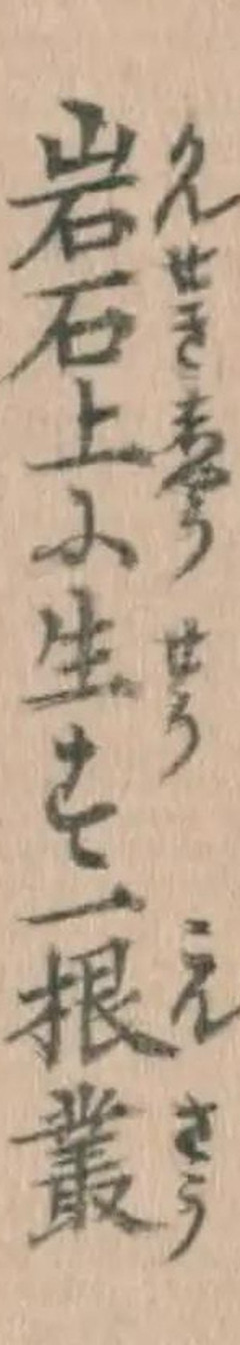岩石上に生す一根叢
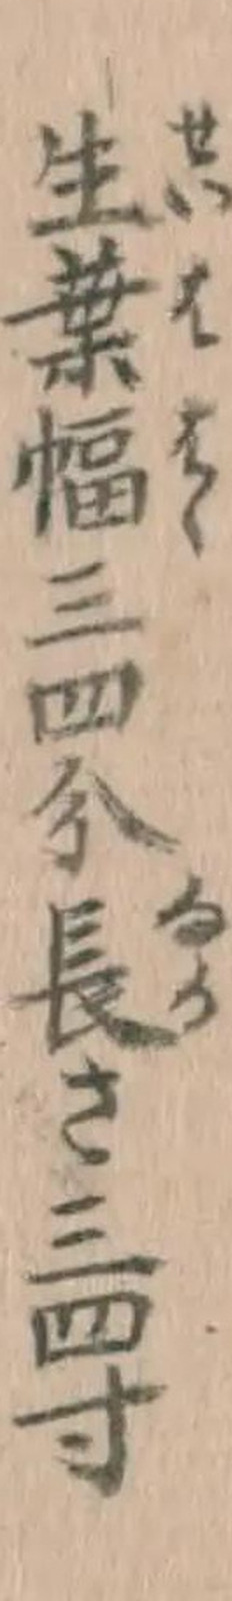生葉幅三四分長さ三四寸
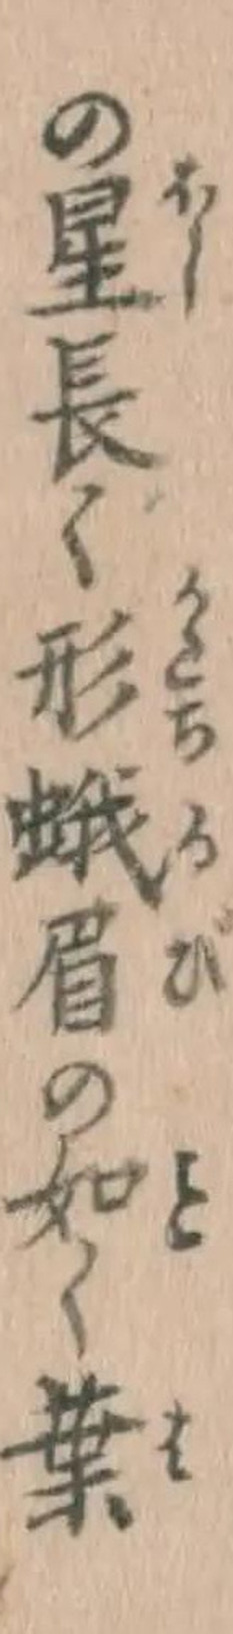の星長く形蛾眉の如く葉
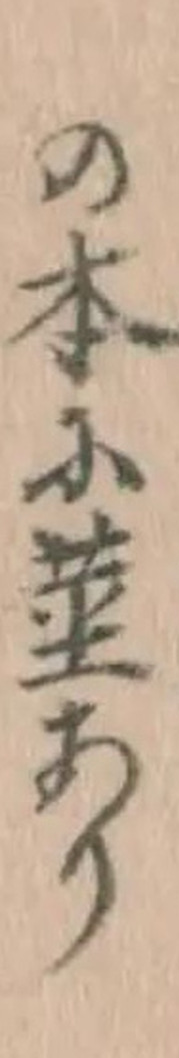の本に茎あり

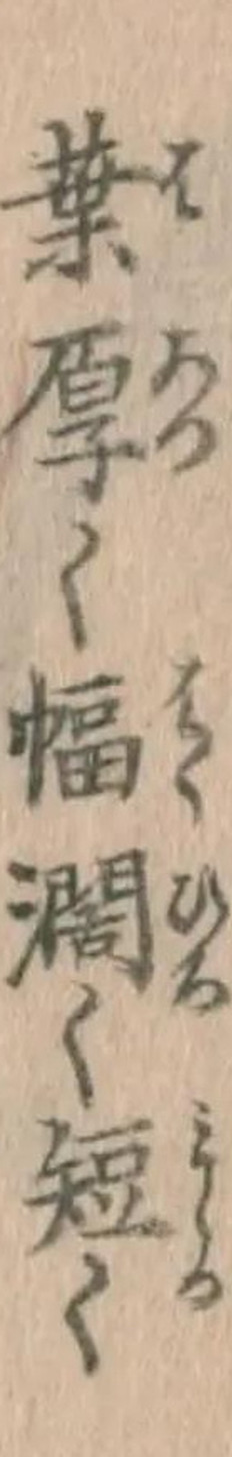葉厚く幅闊く短く
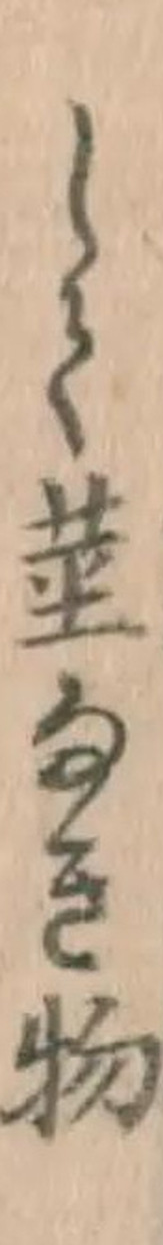して茎なき物
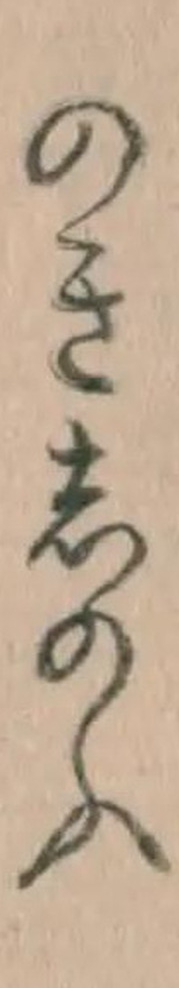のきしのふ
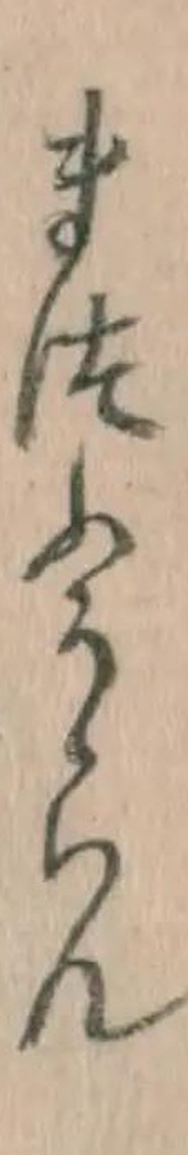まつふうらん
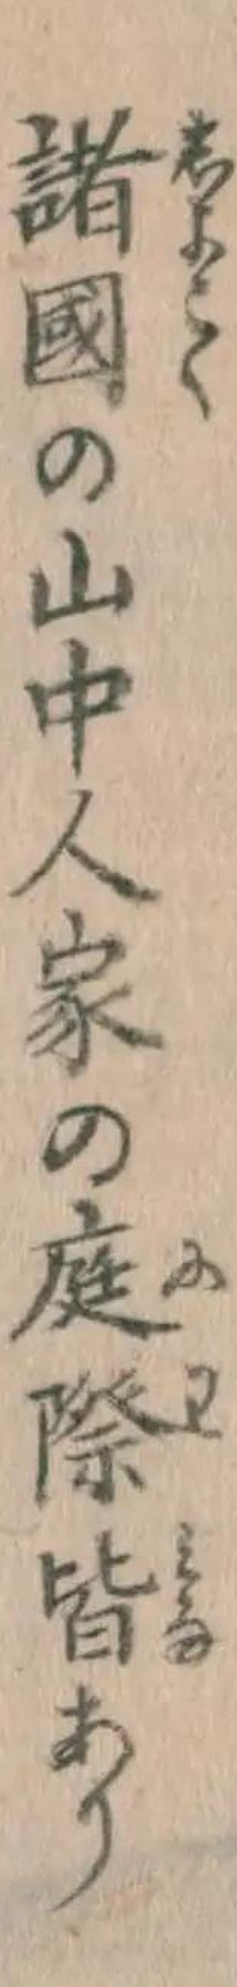諸国の山中人家の庭際皆あり
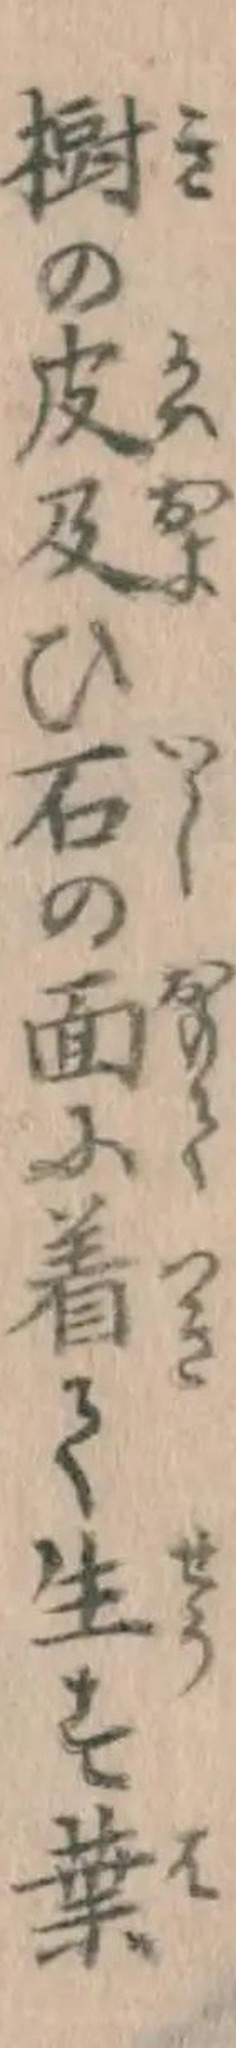樹の皮及ひ石の面に着て生す葉
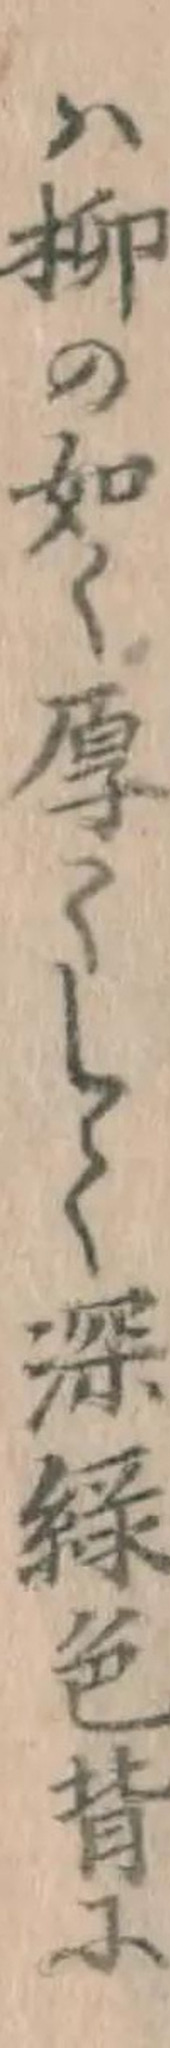は柳の如く厚くして深緑色背に
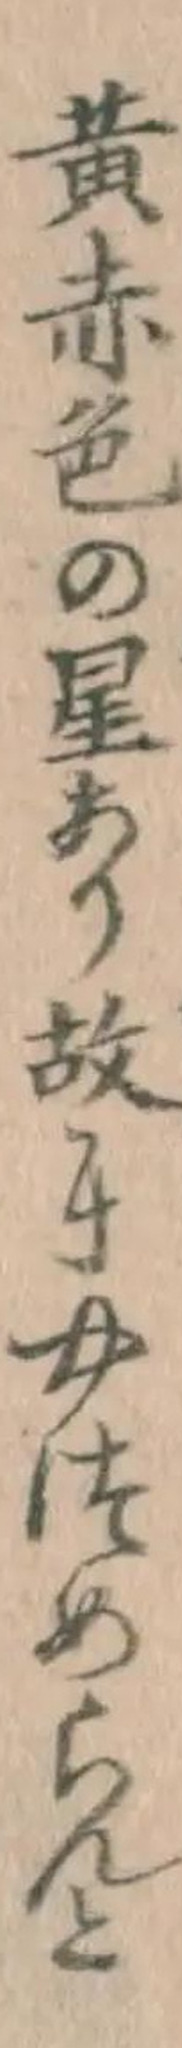黄赤色の星あり故にやつめらんと

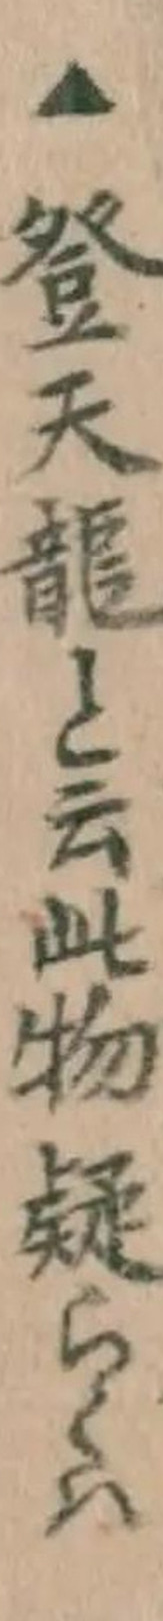▲登天竜と云此物疑らくは
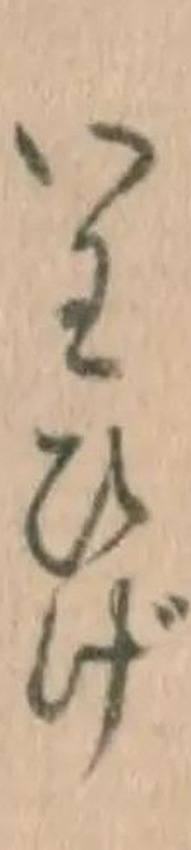いわひげ
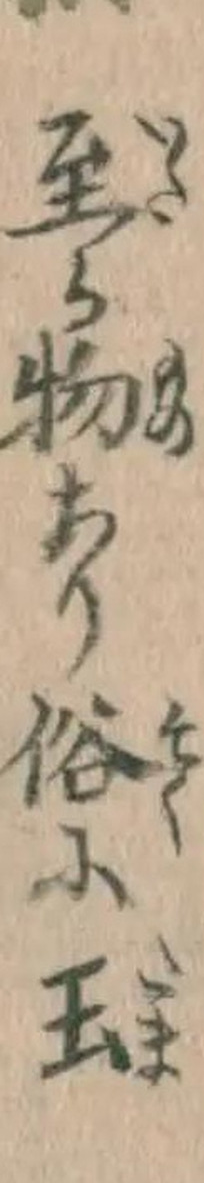至る物あり俗に玉
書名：本草図譜. 巻34-36
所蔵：国立国会図書館 National Diet Library, JAPAN
